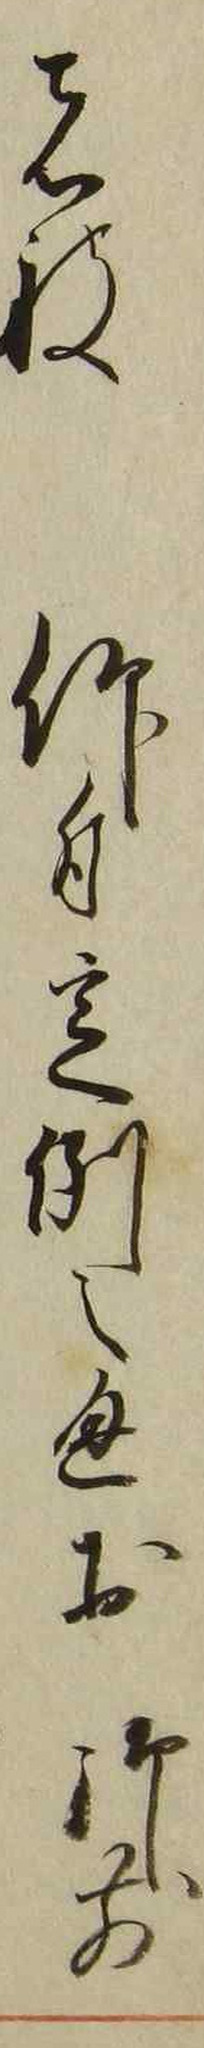者被仰付定例之通於御前
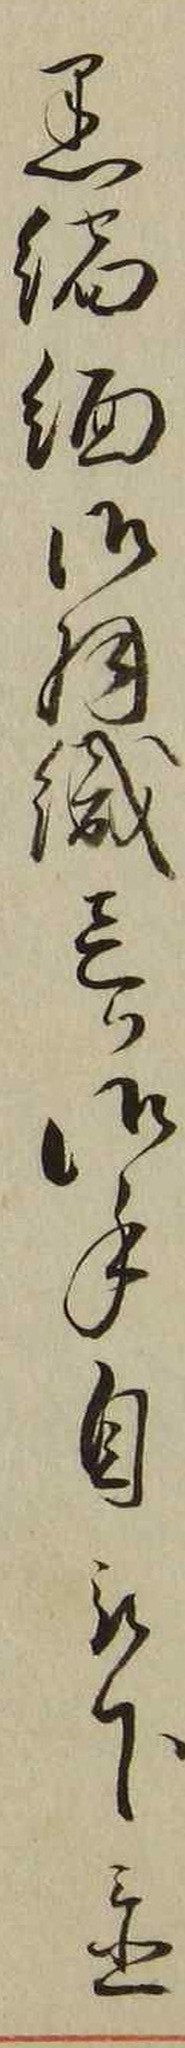黒縮緬御羽織壱ツ御手自被下置
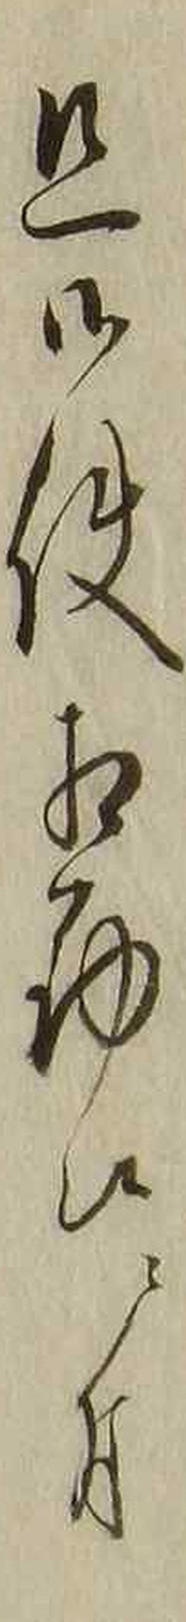且御使相勤候ニ付
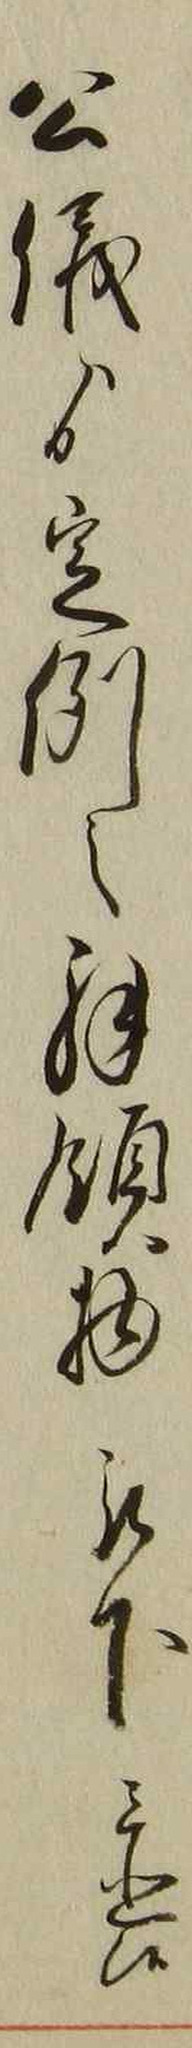公儀ゟ定例之拝領物被下置候
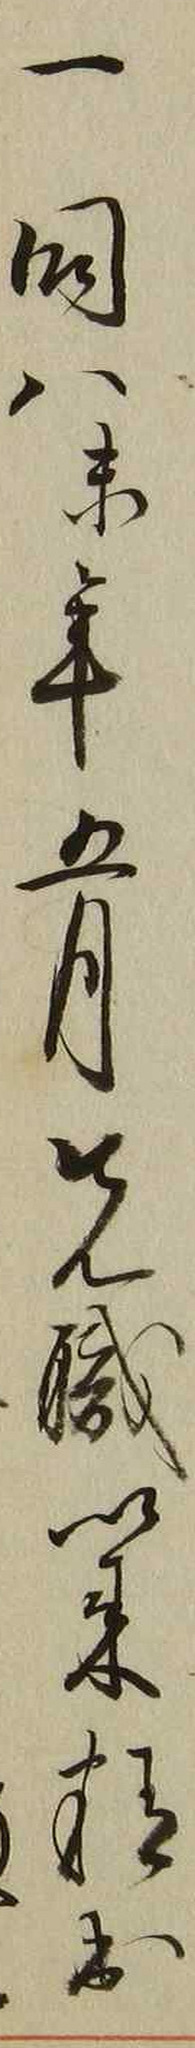一同八未年五月先職以来精出
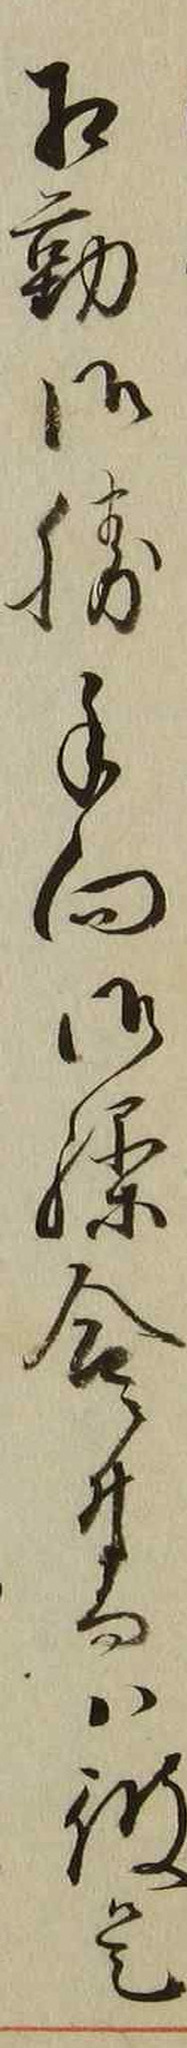相勤御勝手向御繰合ニ付而ハ彼是
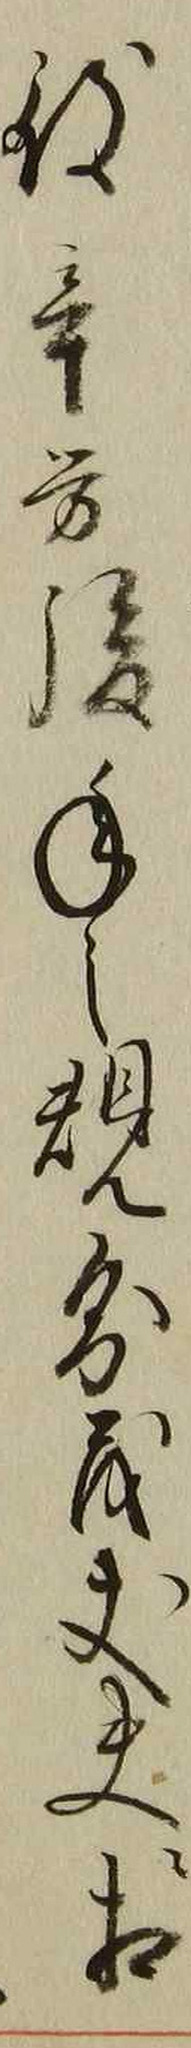致辛労後年之規則も丈夫ニ相
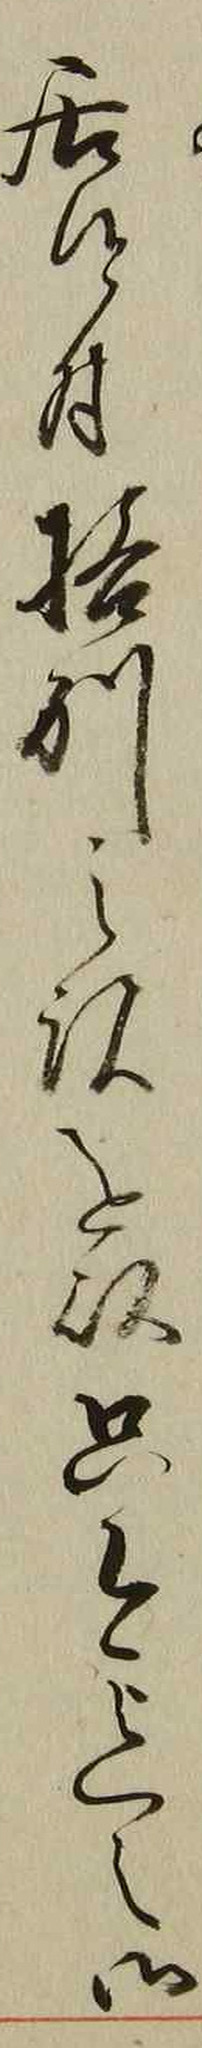居候ニ付格別之訳を以只今迄之御
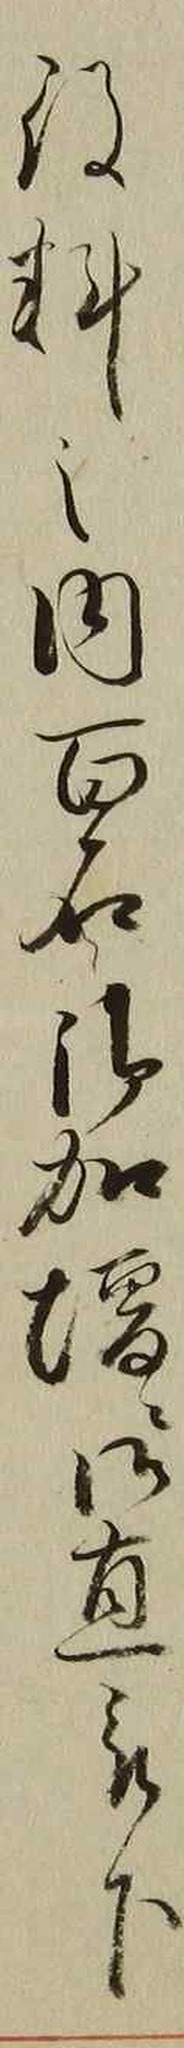役料之内百石御加増ニ御直被下
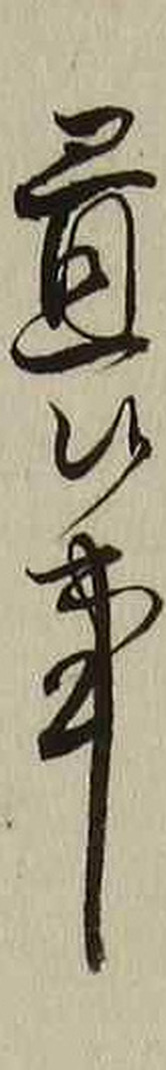置候事
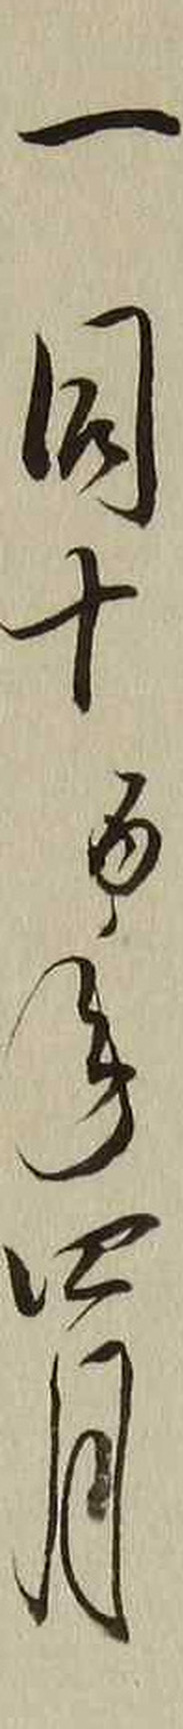一同十酉年四月
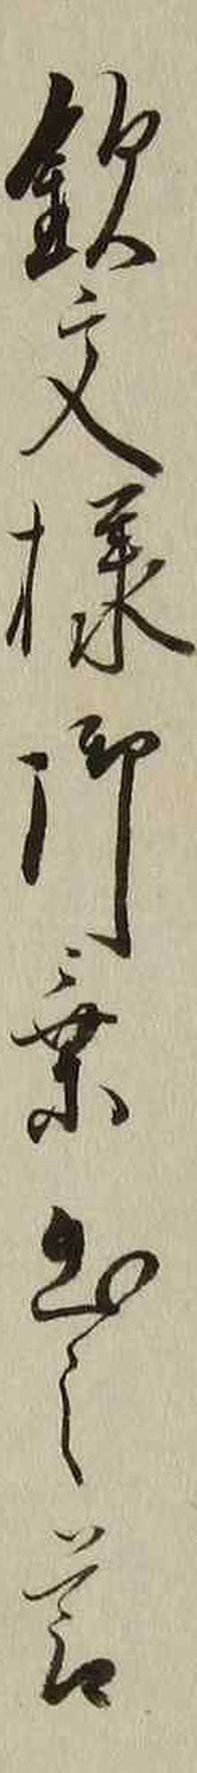欽文様御乗出之節
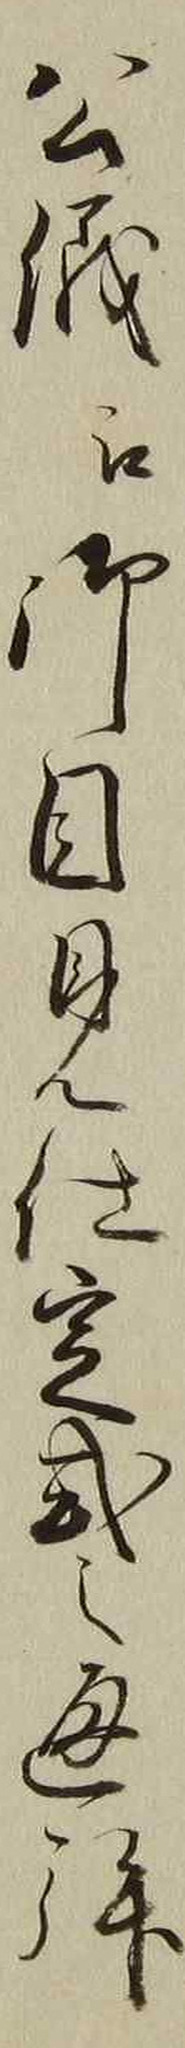公儀江御目見仕定式之通拝
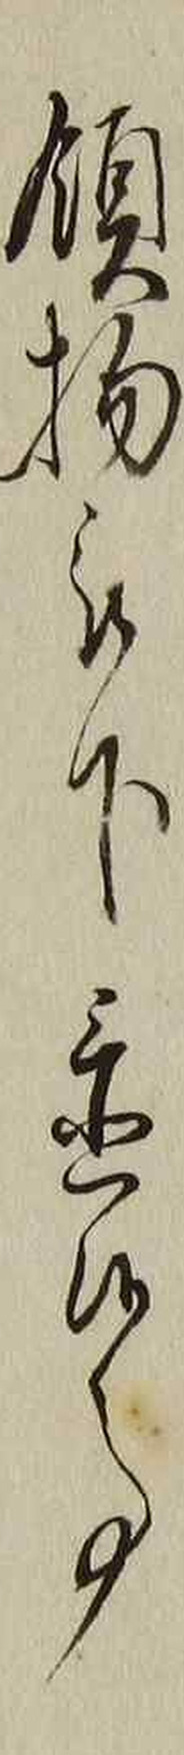領物被下置候事
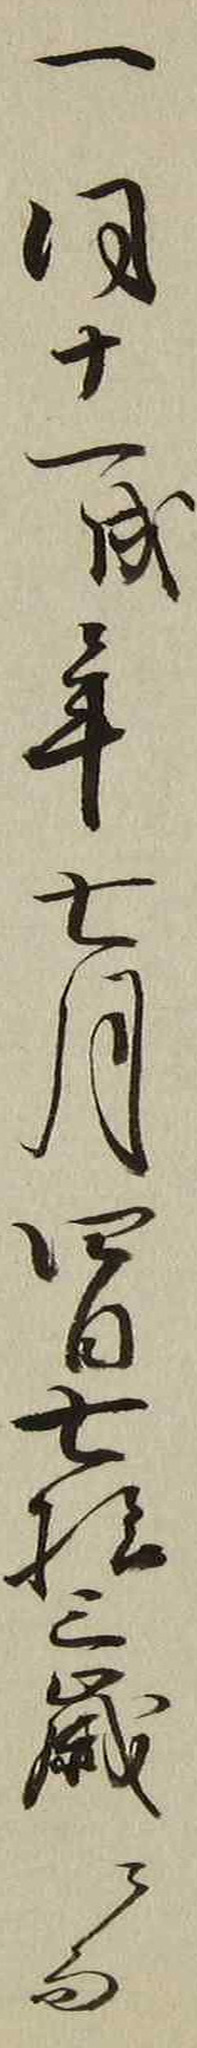一同十一戌年七月四日七拾三歳ニ而
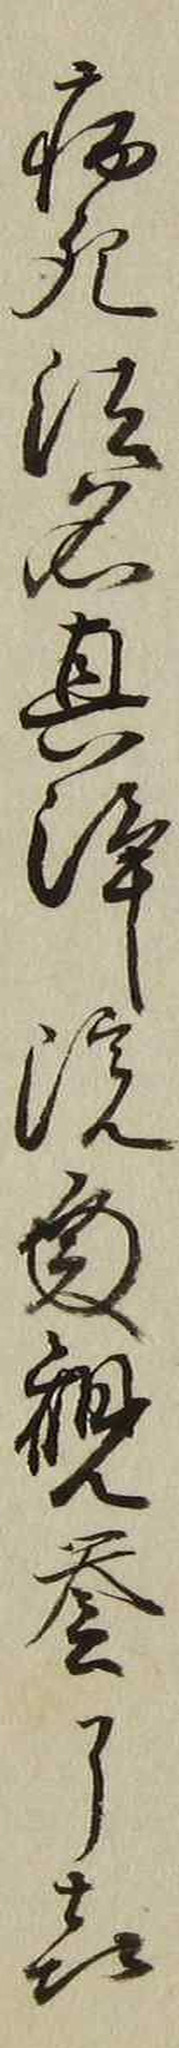病死法名真浄院殿観誉了喜
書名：諸士系譜　巻之2　い之部2
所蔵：会津若松市立会津図書館
